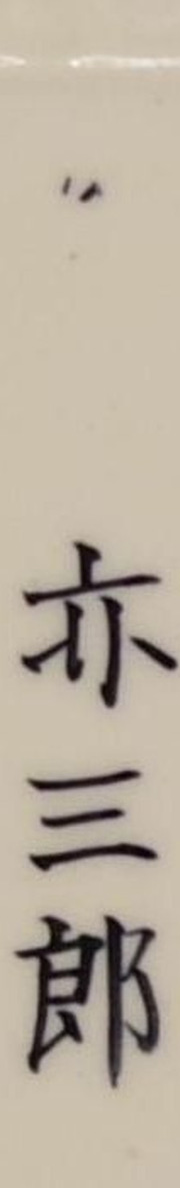亦三郎
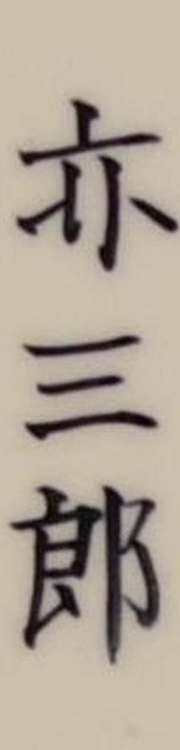亦三郎
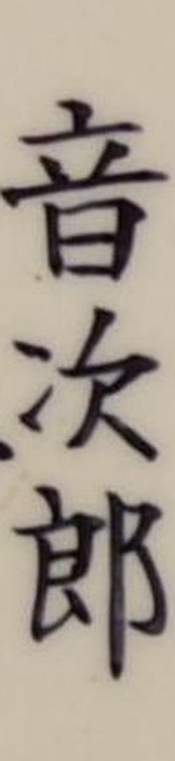音次郎
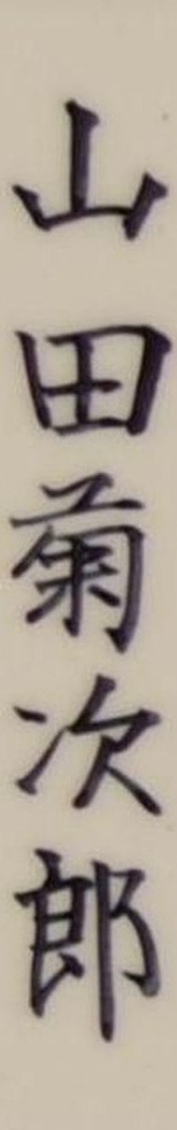山田菊次郎
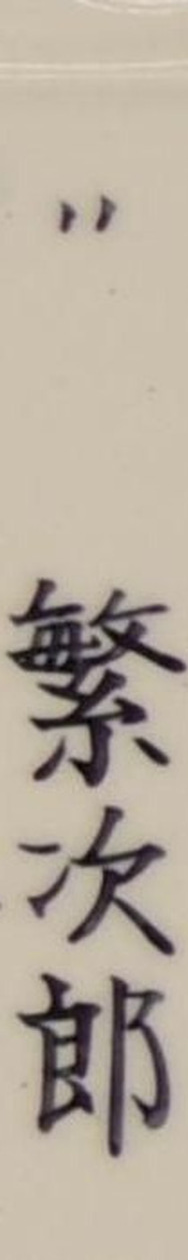繁次郎
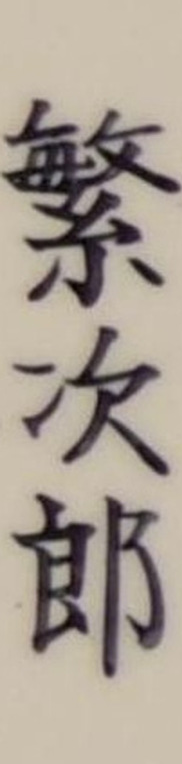繁次郎

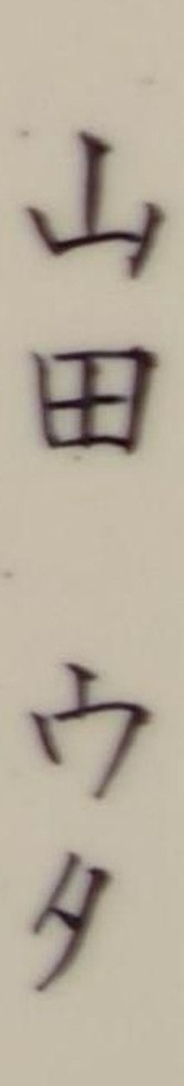山田ウタ
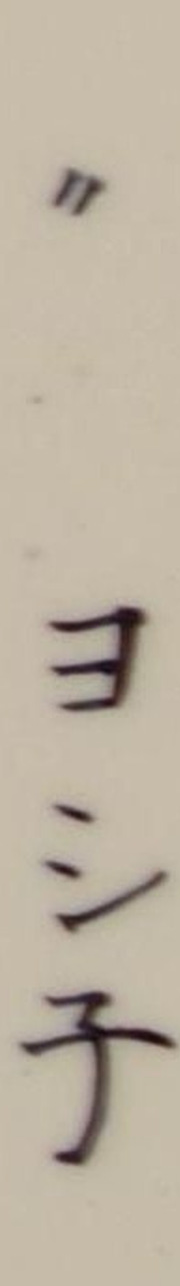ヨシ子
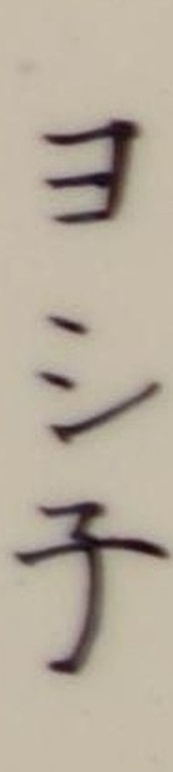ヨシ子
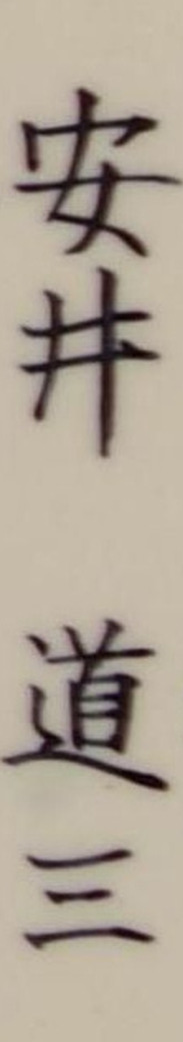安井道三
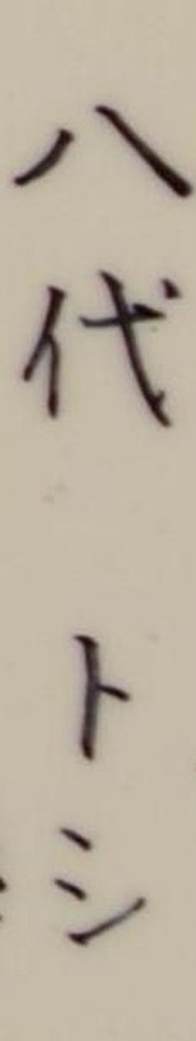八代トシ
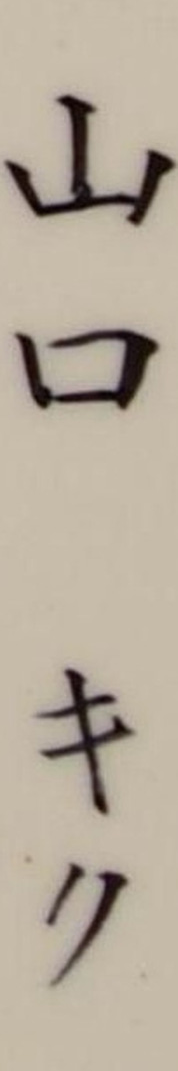山口キク
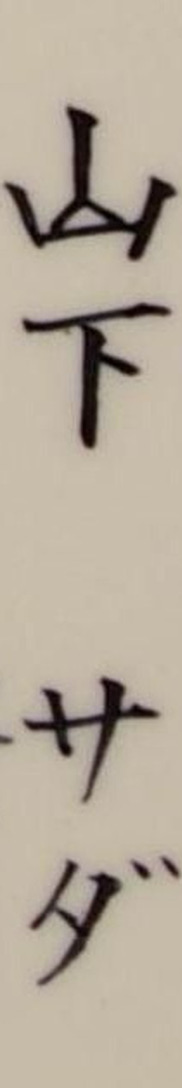山下サダ
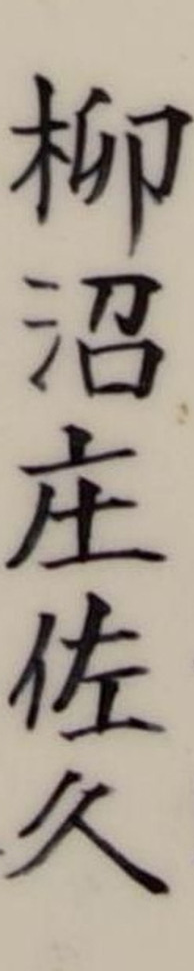柳沼庄佐久
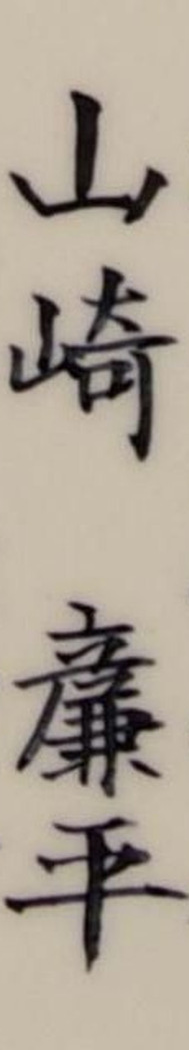山崎廉平
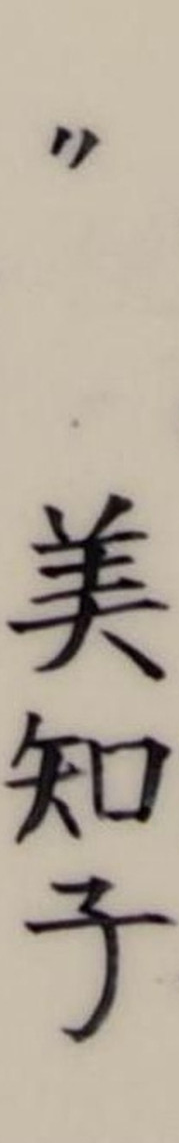美知子
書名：M~S
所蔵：高野山金剛峯寺
